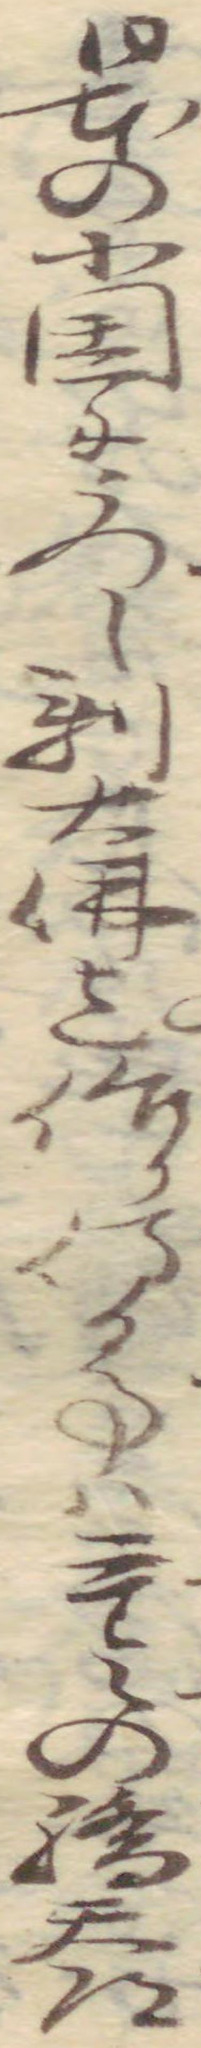日本の小国にうつし剰大仏迄作り侍る事は重〻の驕天道
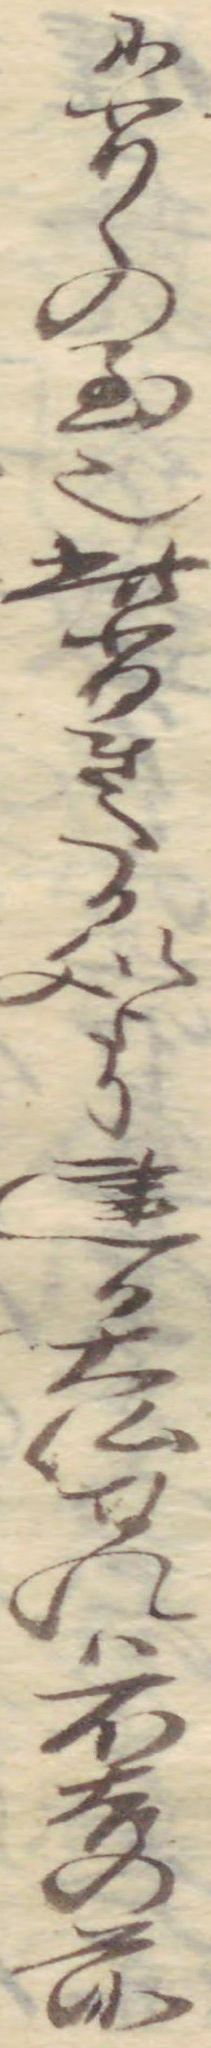に背くの国也此背きたる処より建る大仏なれは不吉の前
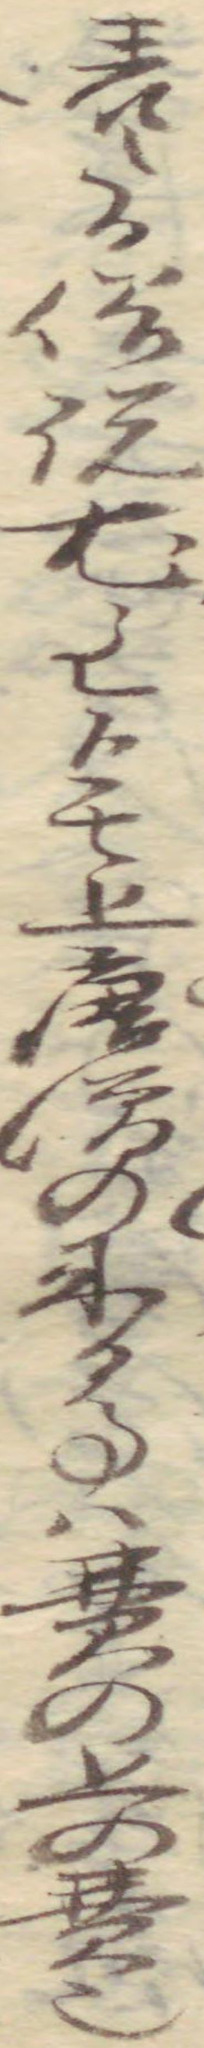表たる俗説尤ニて候其上唐僧の来る事は費の上の費也
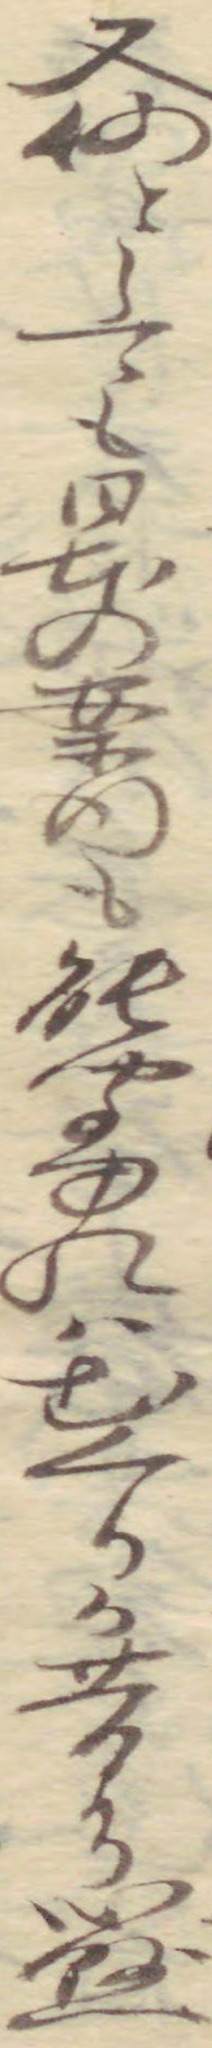又何としても日本の案内も能聞ゆれはむくりか昔より心懸
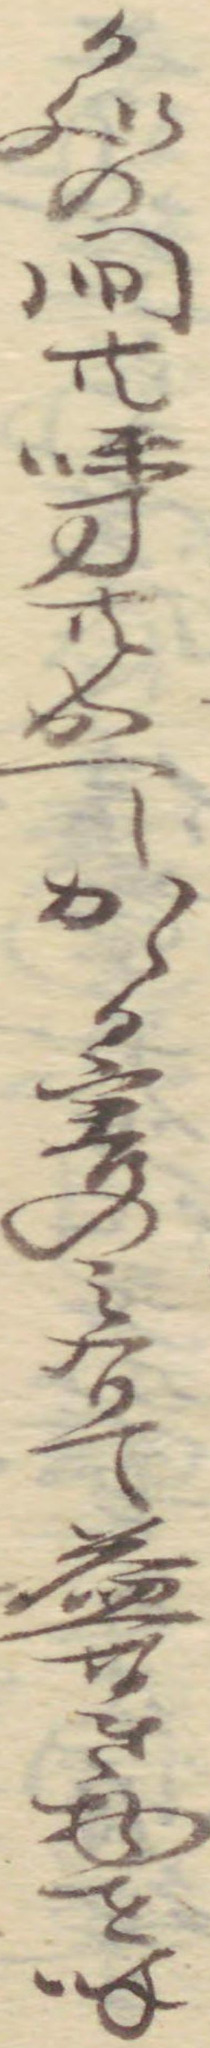る処の共味方共成へしかゝる害のみ有て益なき物を呼
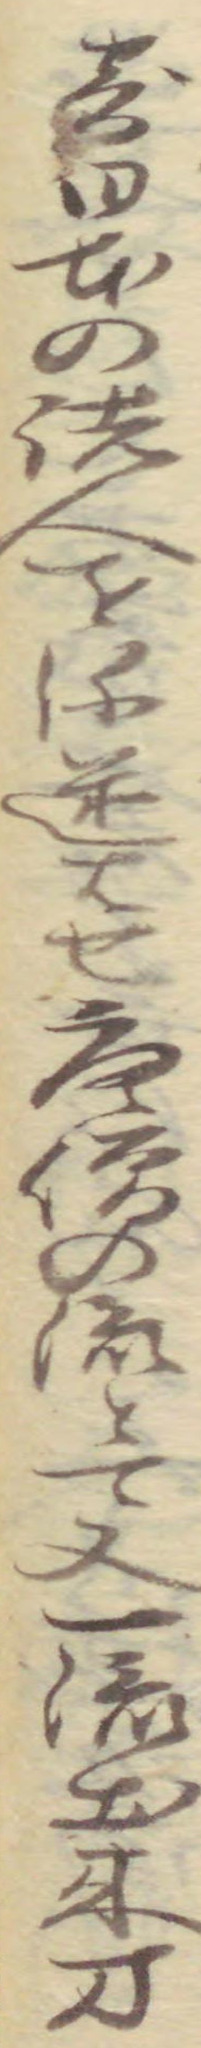寄日本の諸人を弥迷はせ唐僧の流とて又一流出来方
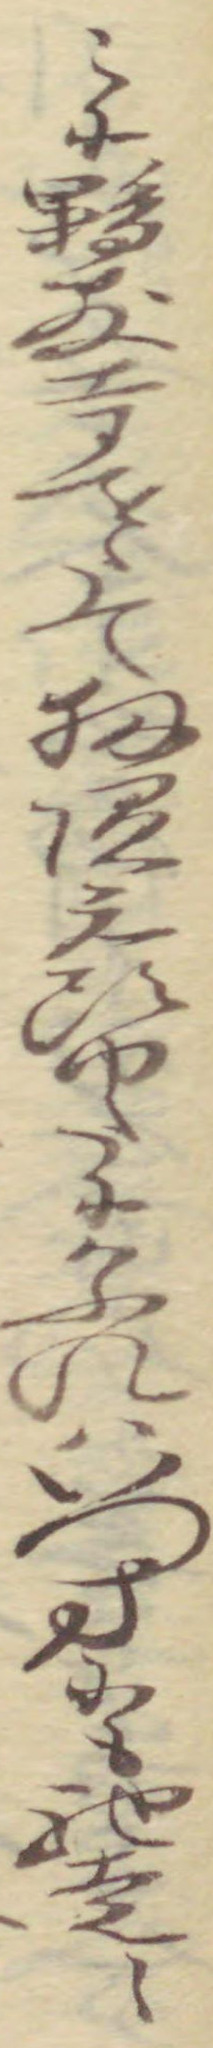〻に夥敷寺をたて扨隠元頭巾たにかふれはいつ方にも馳走し
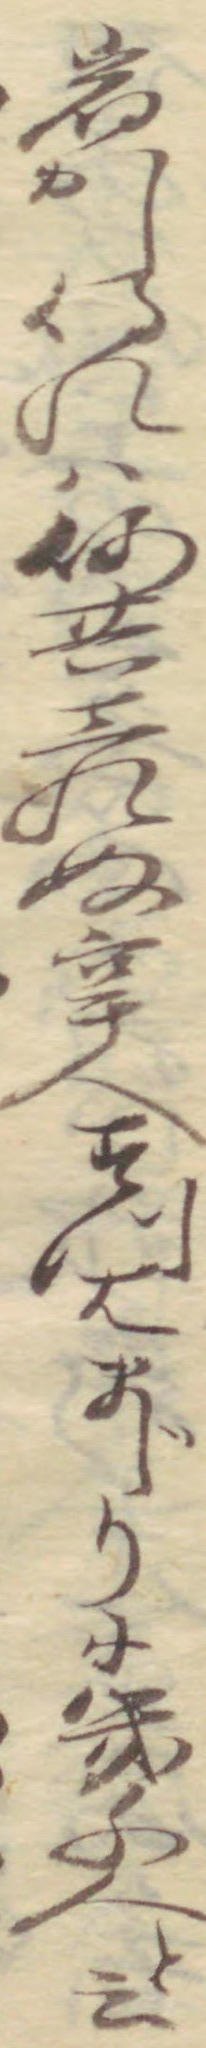宿かし侍れは何共しれぬ牢人すつはまじりに幾千人と云
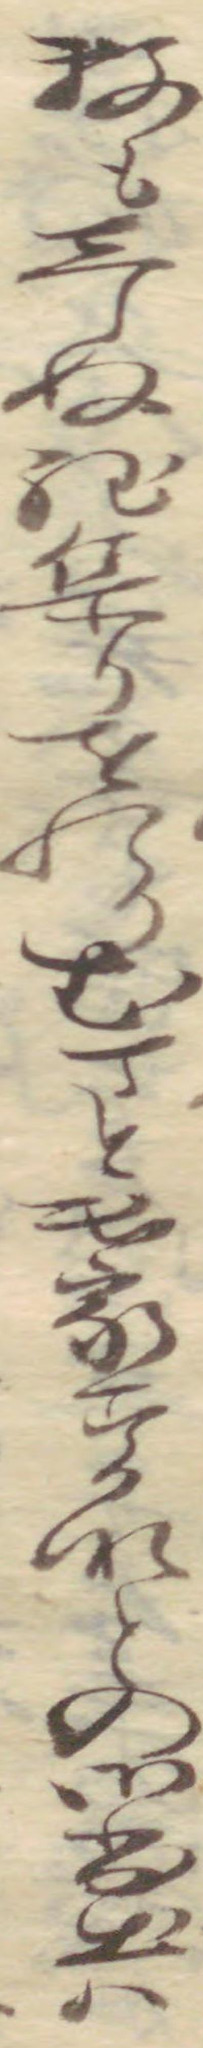数もしらぬ程集りをれりむさと出家するなとの御書出は
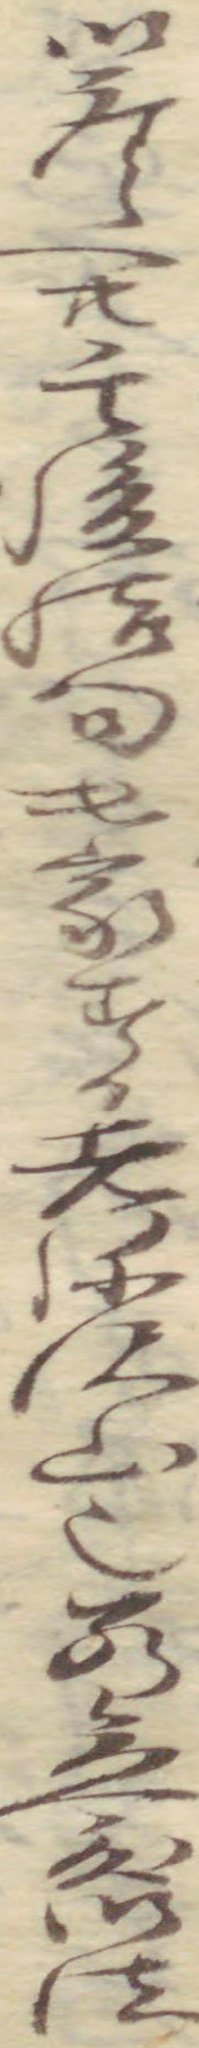御座候へ共其地結句出家する者弥沢山なり若急度御法
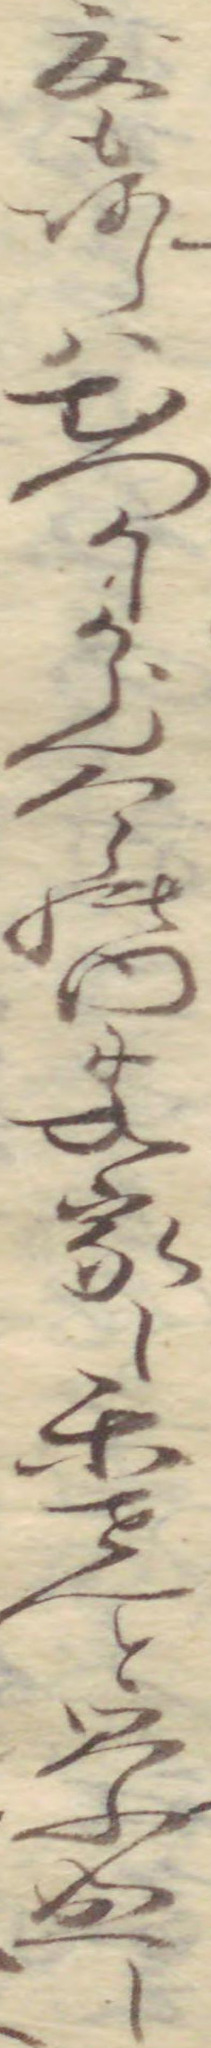度もあらはむつかしからん今の内に出家し楽せんと思ふ成へし
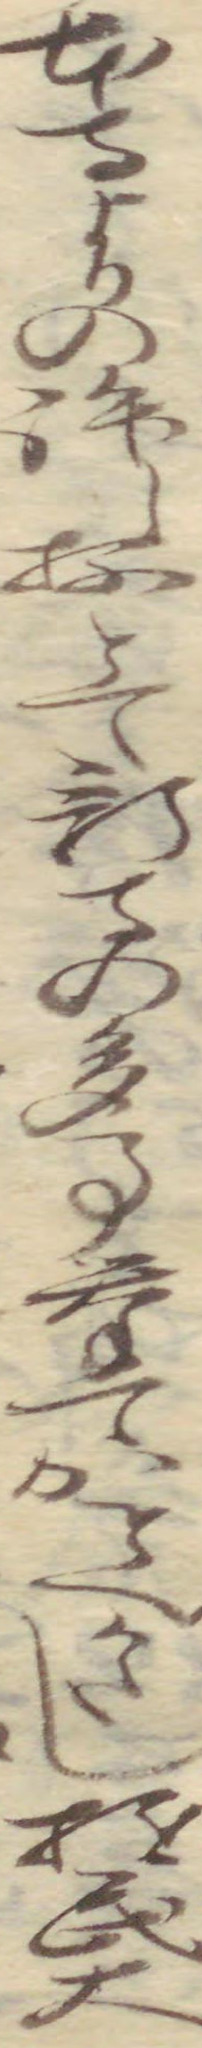本寺よりの許し抔とて新寺の多事挙てかそへかたし遊民大
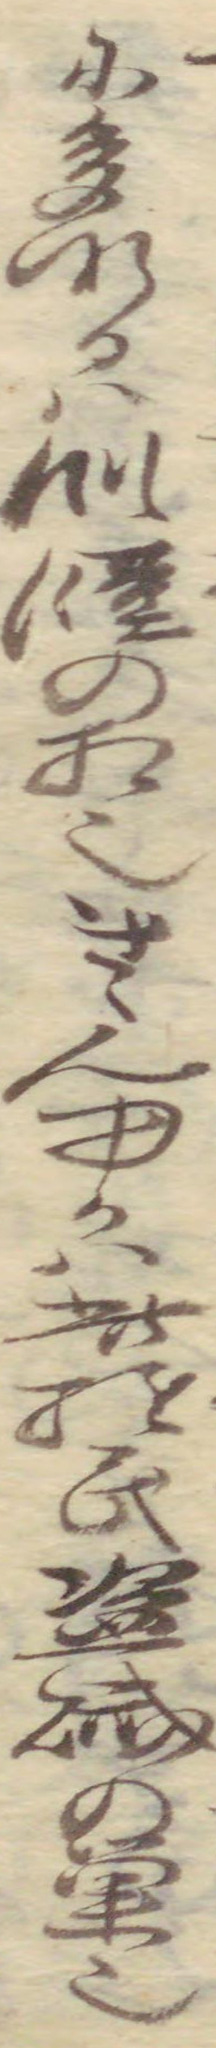に多なるは飢饉の相也きゝんゆかは此遊民盗賊の巣也
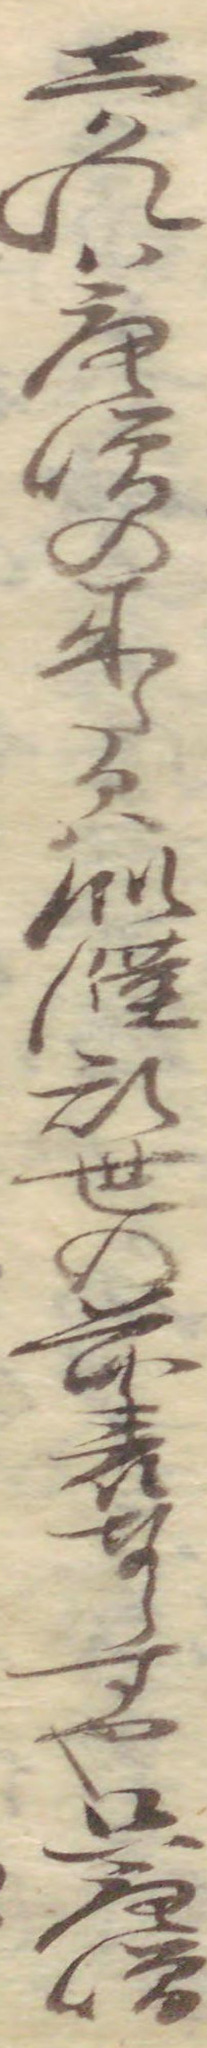しかれは唐僧の来たるは飢饉乱世の前表ならすや只唐僧
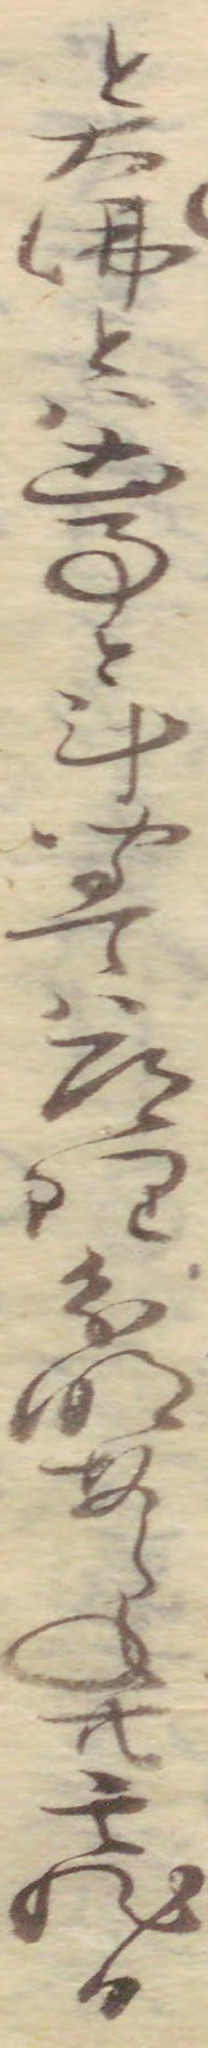と大仏とは凶事と計聞ては道理分明ならね共其然る
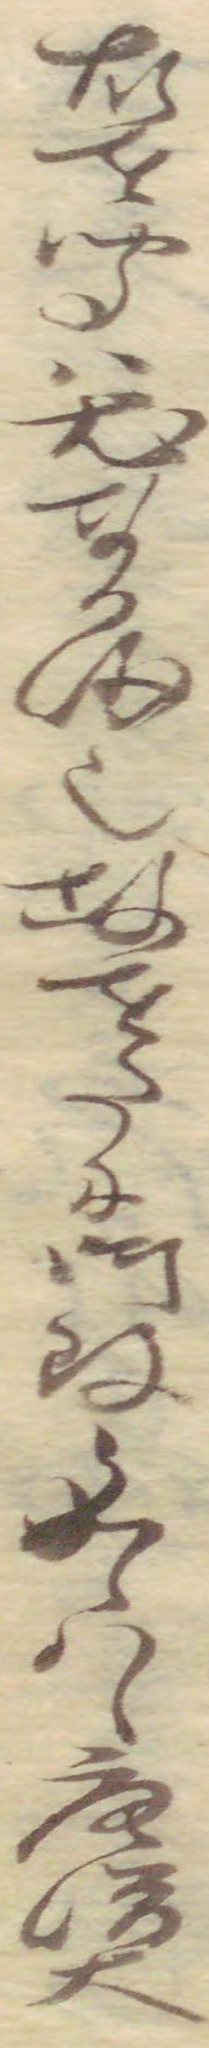故を聞は尤なる儀なり故をたに御改被成候はゝ唐僧大
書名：鶯宿雑記. 巻263-264
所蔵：国立国会図書館 National Diet Library, JAPAN
